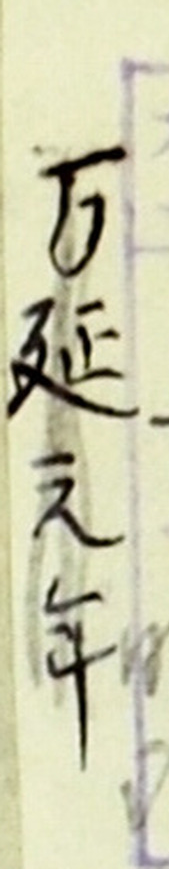万延元年
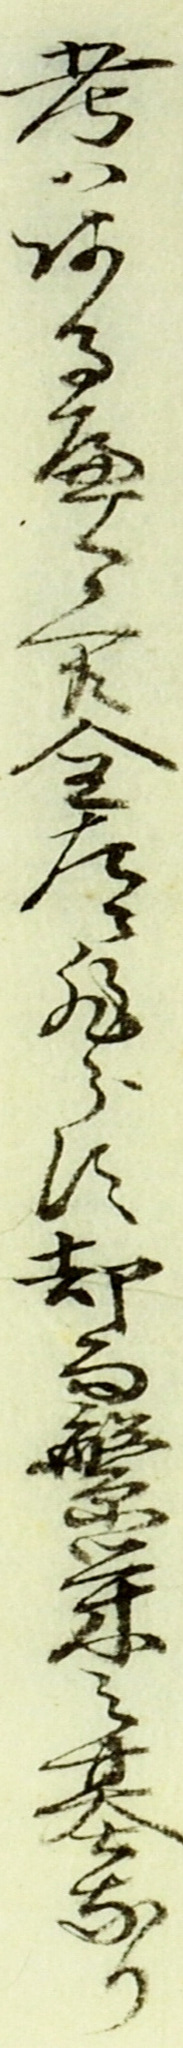考はあるへく候へ共全左ニ然らす却而繁栄之基なり
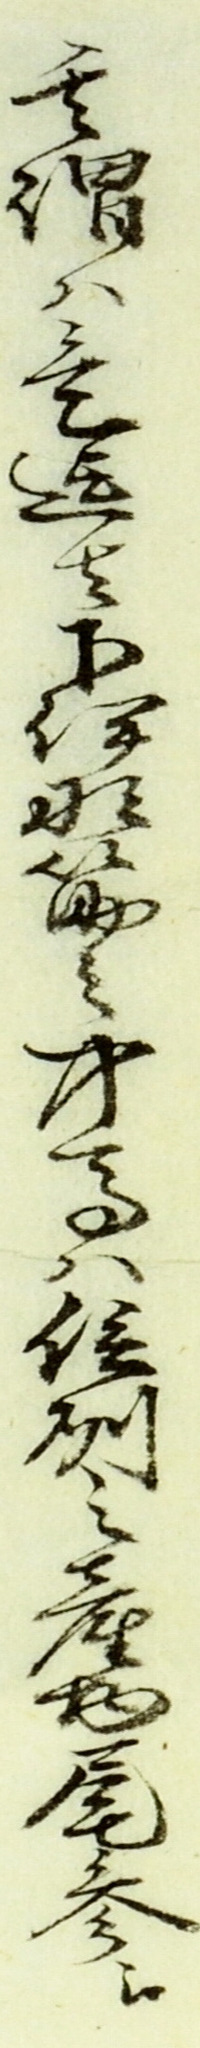其謂は是迄は下伊那筋之中馬は信州之産物尾参江
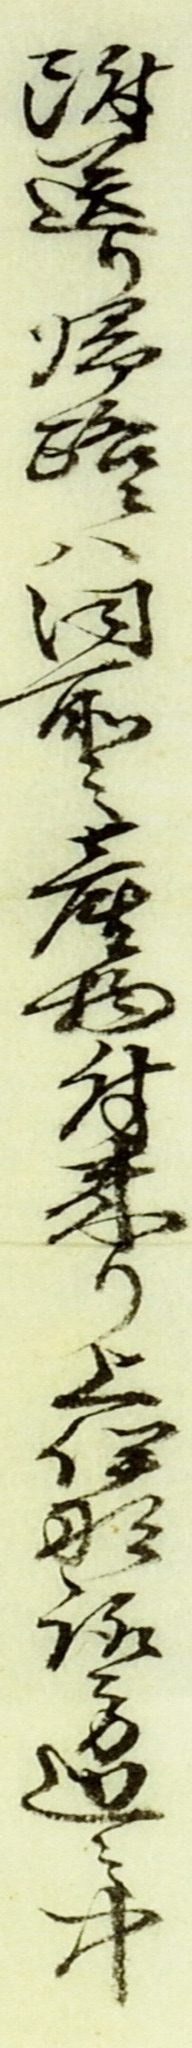附送り帰路ニは同所之産物付来り上伊那諏方辺之中
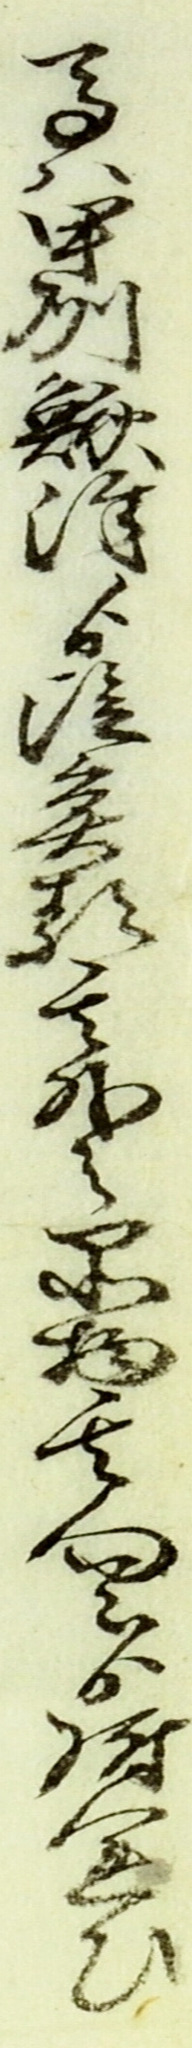馬は甲州鰍澤より塩魚類其外之品物其向々より附運ひ
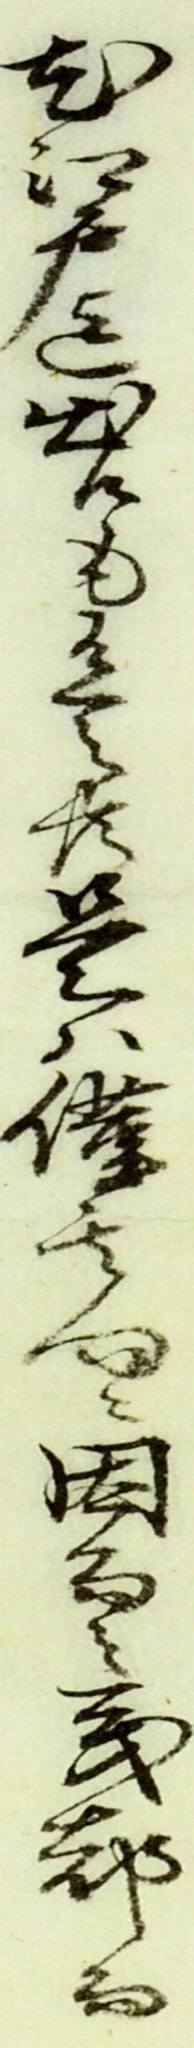尤江戸迄出候も有之共是は僅其向ニ因而之義都而
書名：中馬共稼方繁栄之根本申諭
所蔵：伊那市立高遠町図書館・合同会社AMANE
